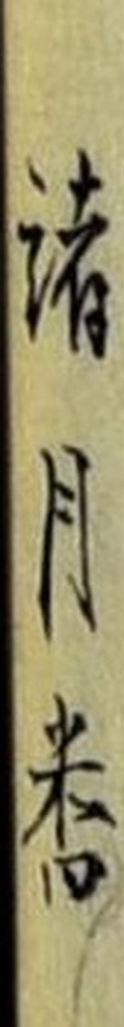諸月番
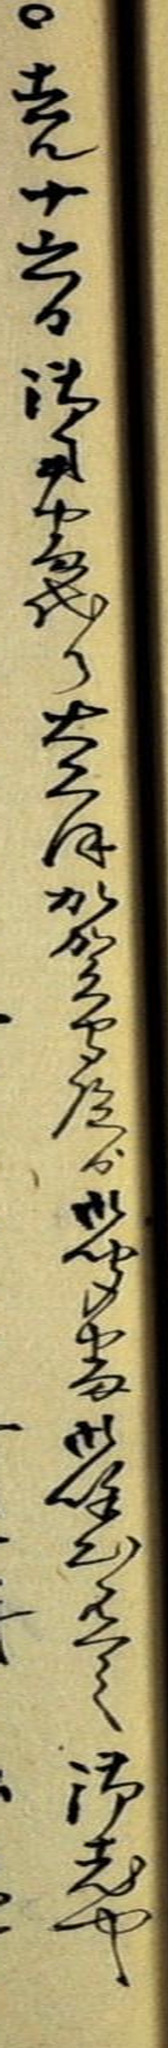○去ル十六日御用番代り大久保加賀守殿ゟ御聞番御呼出有之御老中
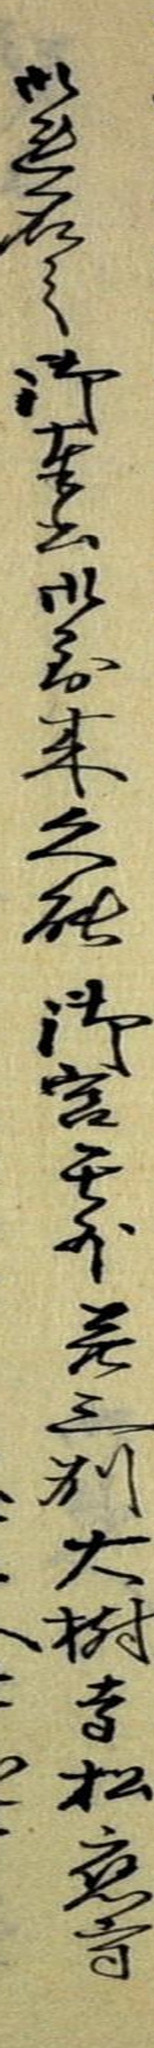御連名之御奉書御到来久能御宮其外并三州大樹寺松応寺
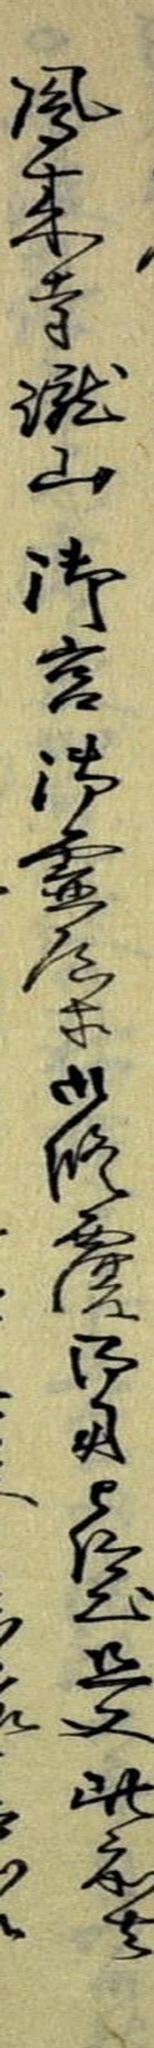鳳来寺瀧山御宮御霊屋等御修覆御用被仰出且又此度者
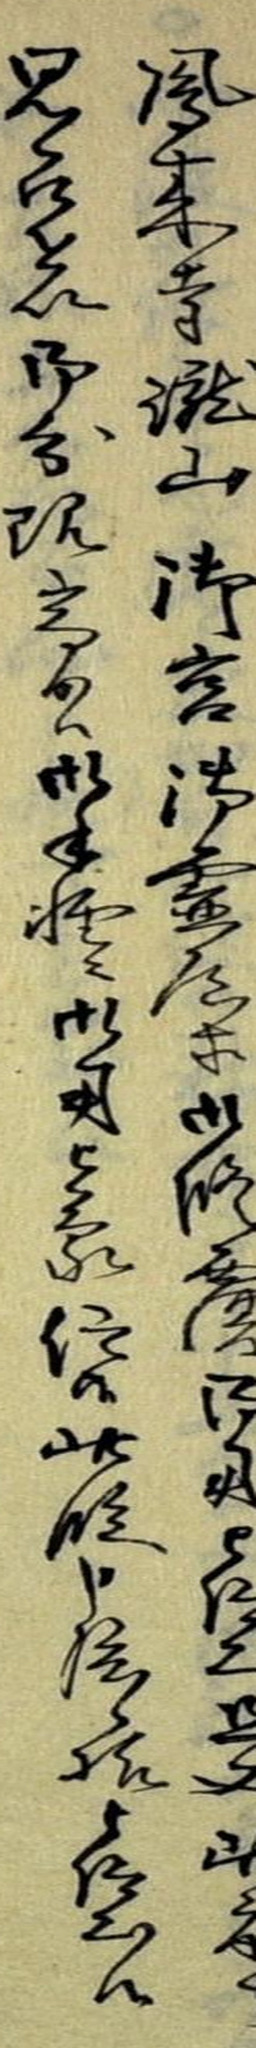思召を以御分限高ゟハ御手軽ニ御用被蒙仰候此段申渡候様被仰出候
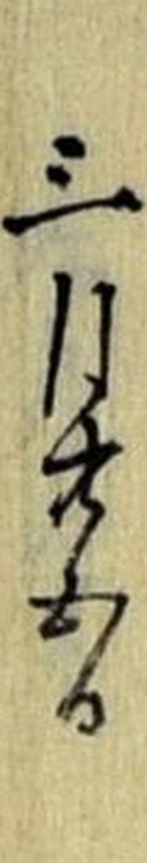三月廿五日
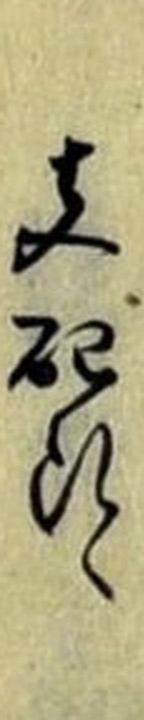支配頭へ
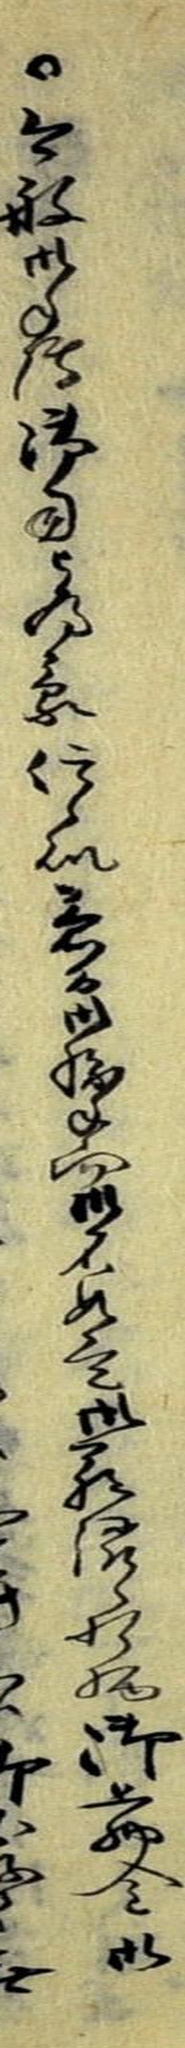○今般御手伝御用被為蒙仰候処兼而御勝手向御不如意御難渋之折柄御上納金御
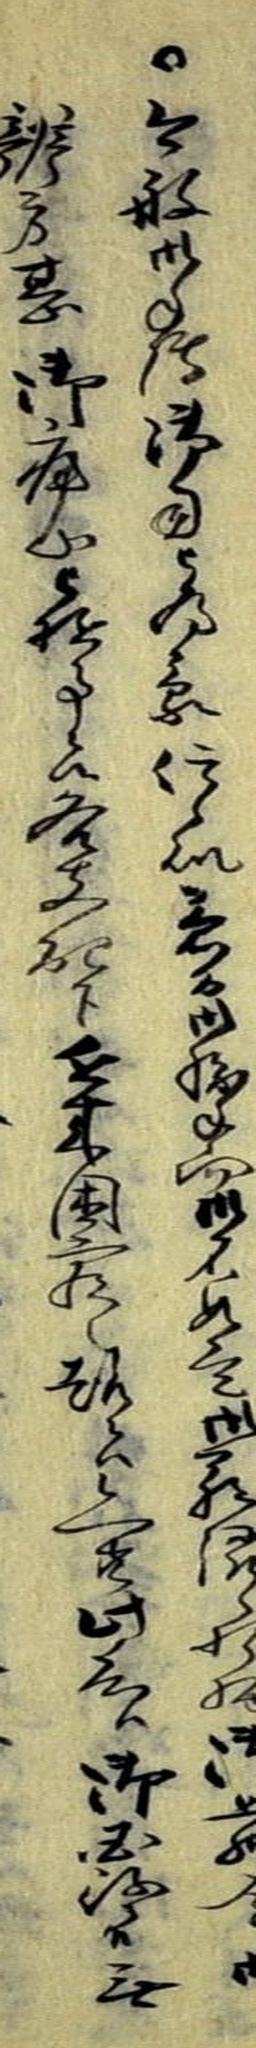弁方甚御痛心被遊事ニ候各支配下近来困窮之趣ニハ候へ共此度ハ御国役ニ付無
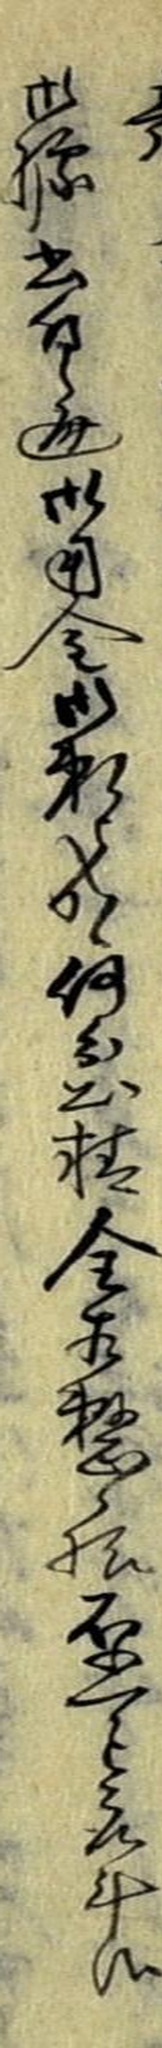御拠書付之通御用金御頼被成候何分出精全相整候様厚可被取計候
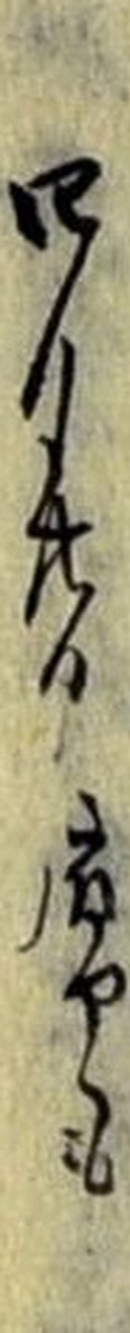四月廿日府中へも
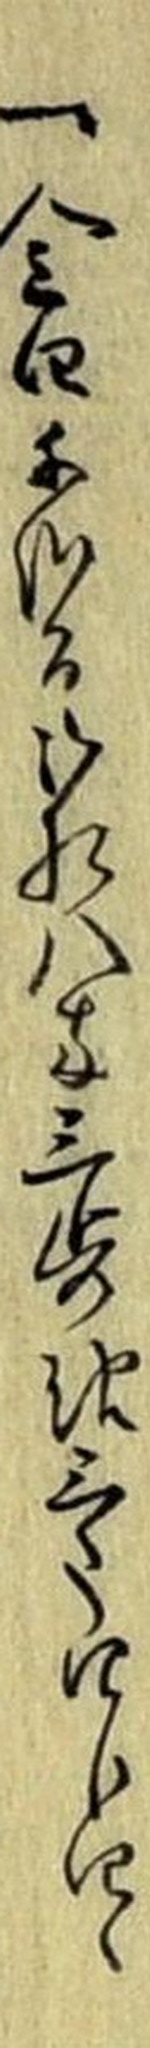一金四千弐百弐拾八両三歩銀三匁四分四厘福井町
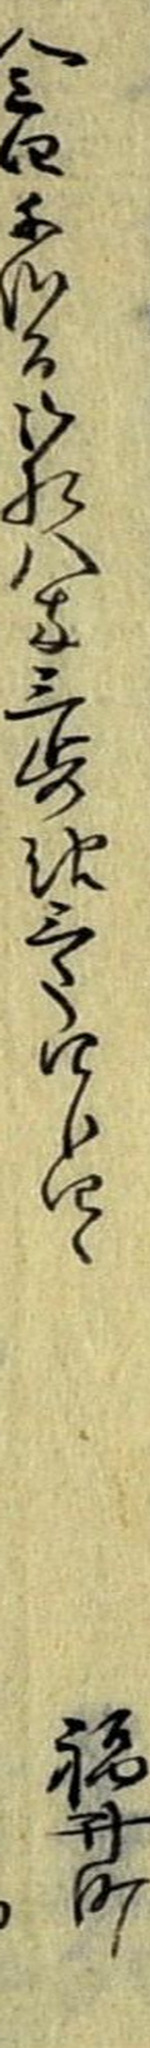一金四千弐百弐拾八両三歩銀三匁四分四厘福井町
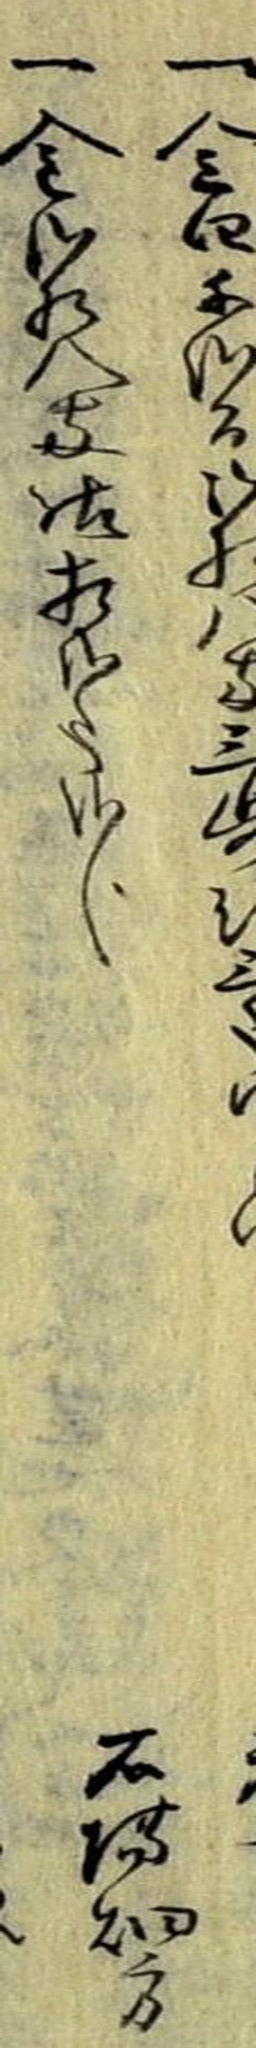一金弐拾八両銀拾弐匁弐分石場畑方
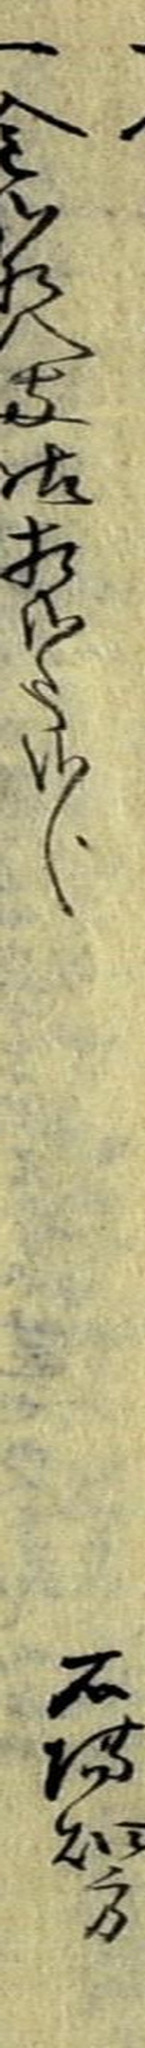一金弐拾八両銀拾弐匁弐分石場畑方
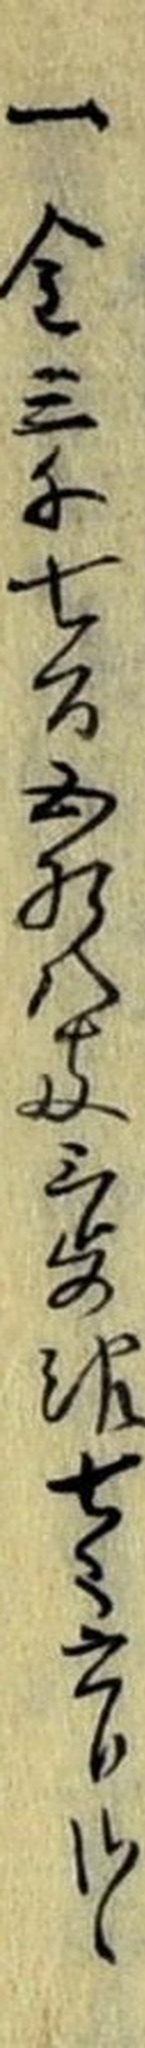一金三千七百五拾八両三歩銀七匁六分弐厘川北領
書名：命令之部 五
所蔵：福井県文書館 Fukui Prefectural Archives
